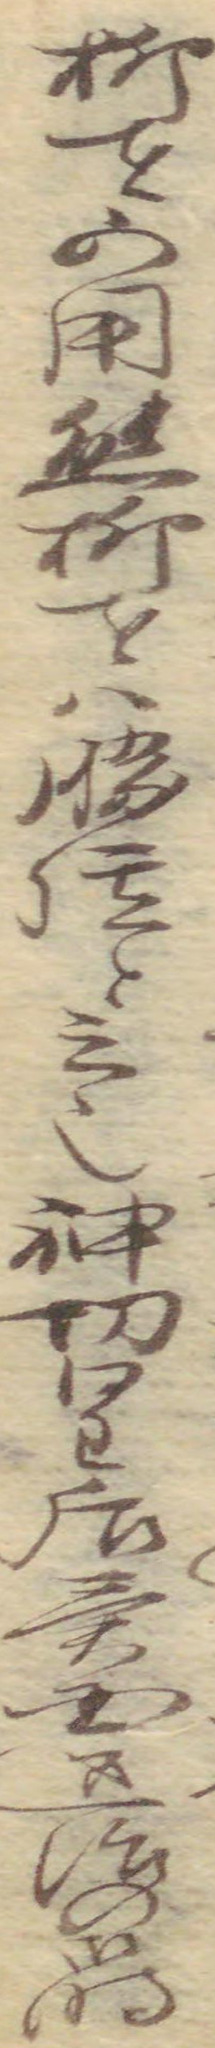柳を可用熊柳をハ勝弦と云也神功皇后異国退治の御時
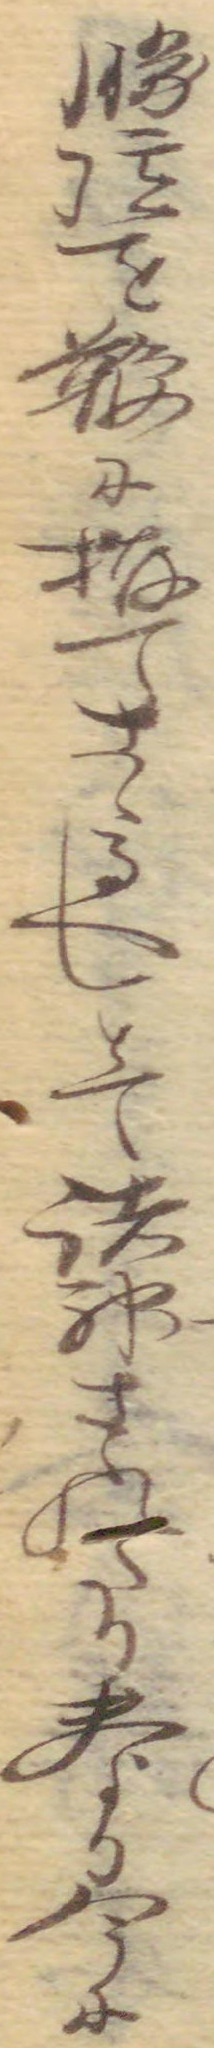勝弦を鞭に拵てさゝるへしとて諸神さゝれたり夫より今に

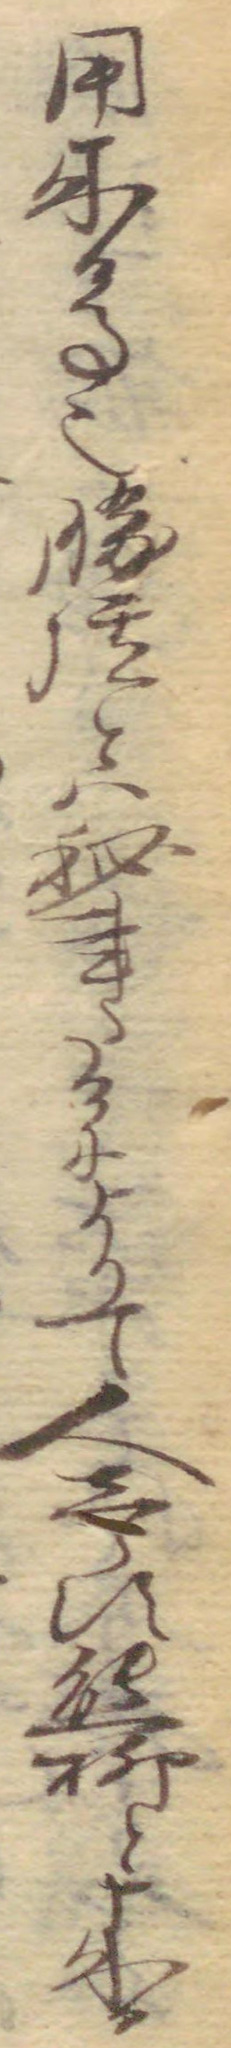用来る事也勝弦とハ秘事たるによりて人しらす熊柳と申来る
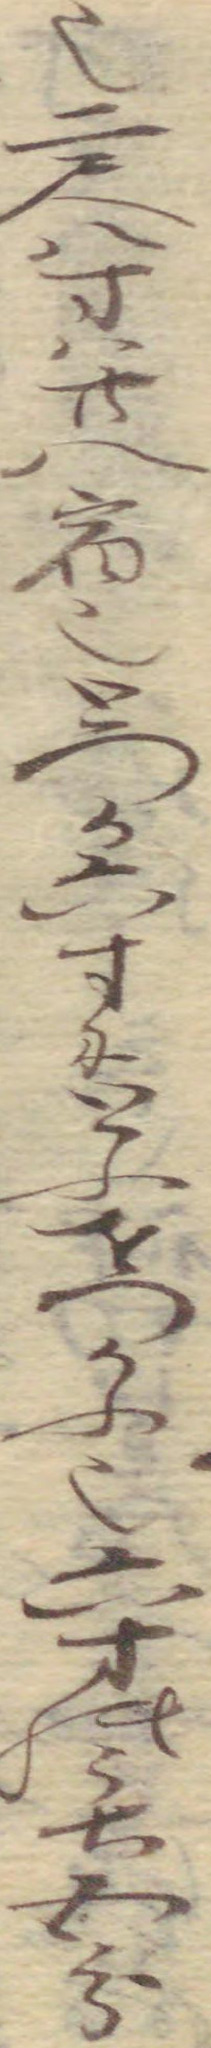也二尺八寸ハ廿八宿也とつか六寸にとふをつかふ也六寸のうち五分
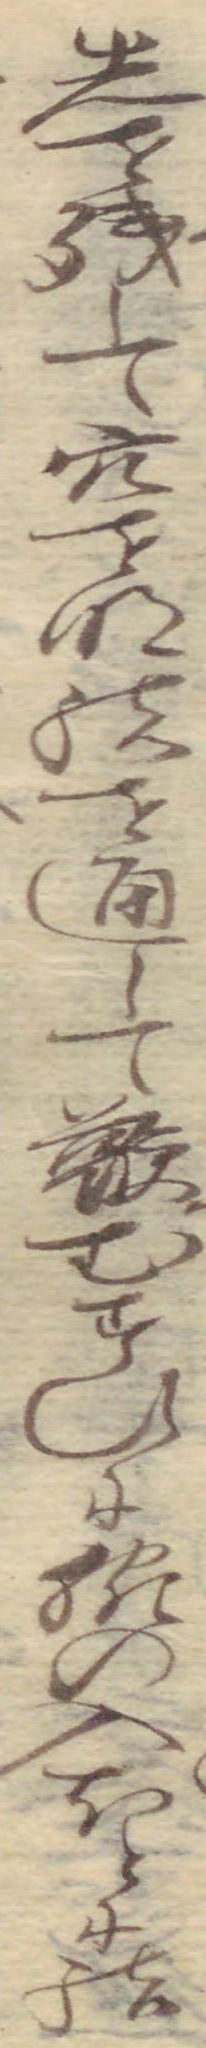先を残して穴を明緒を通して鞭むすひに腕の入ほとに結
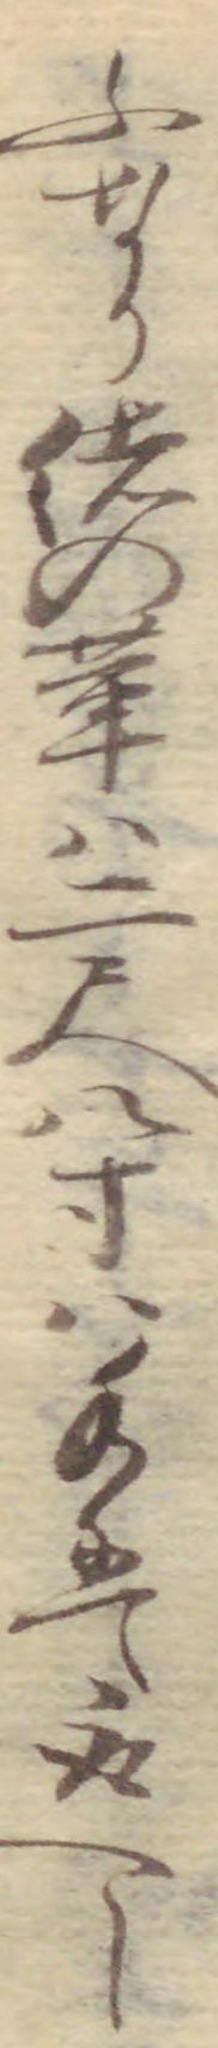ふなり緒の革は二尺八寸ハ手にて取へし
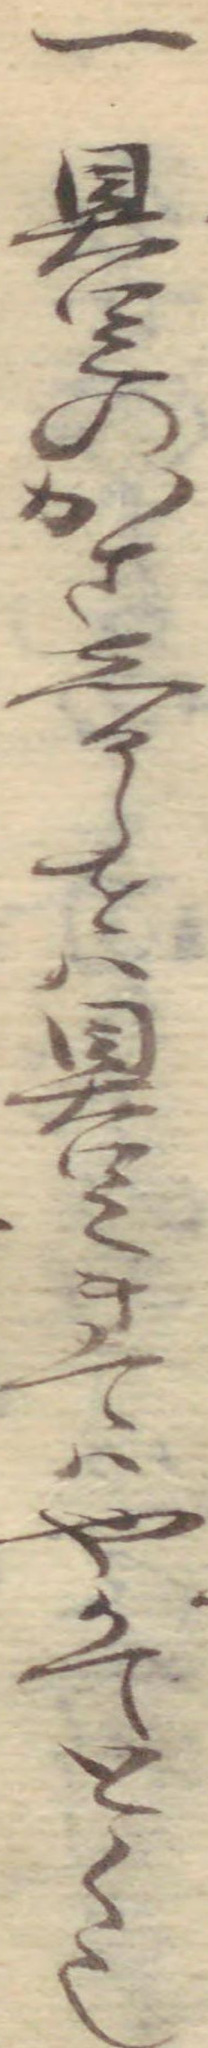一具足のかさしるしをハ具足きてハやかてとく也
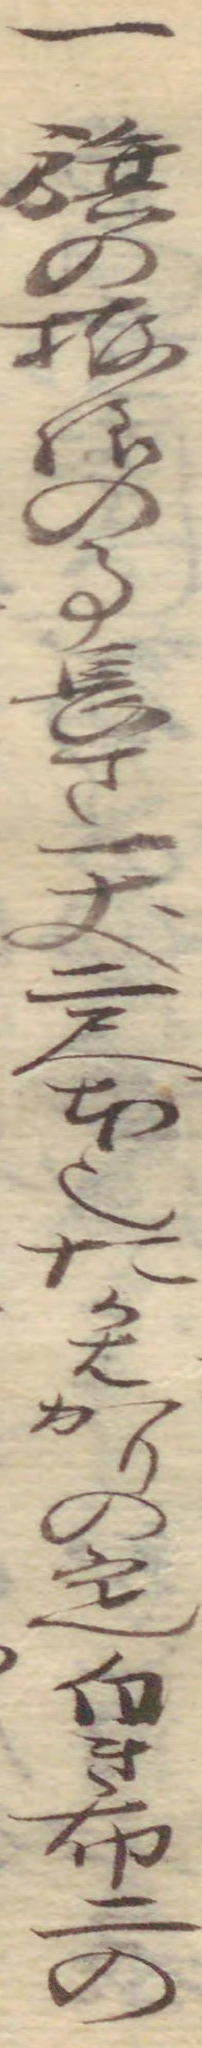一旗の拵様の事長さ一丈二尺本也たかはかりの定白き布二の
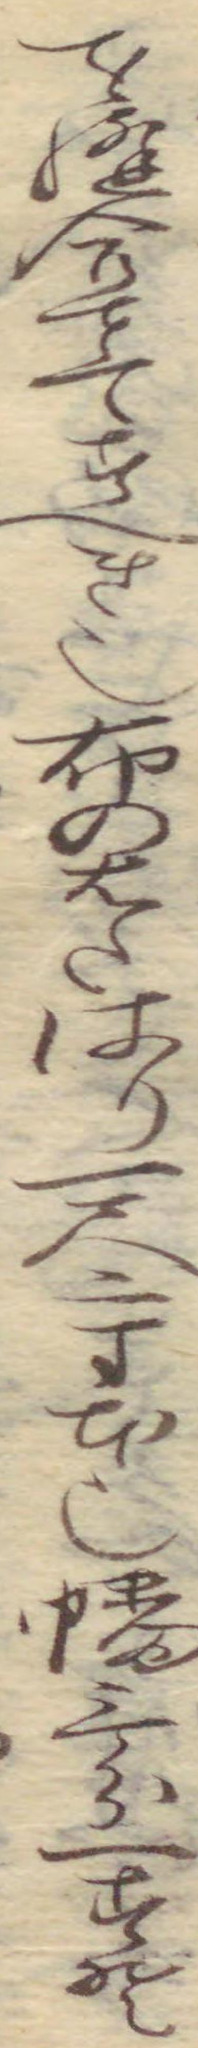を縫合せてすへき也布のはたはり一尺二寸本也幡三分一すそ
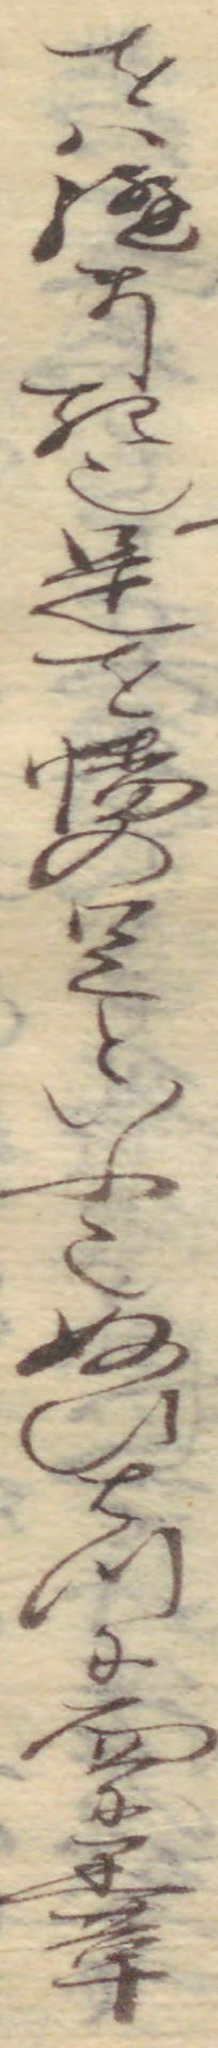をハ縫ましき也是を幡の足といふ也ぬひはつに西に黒革
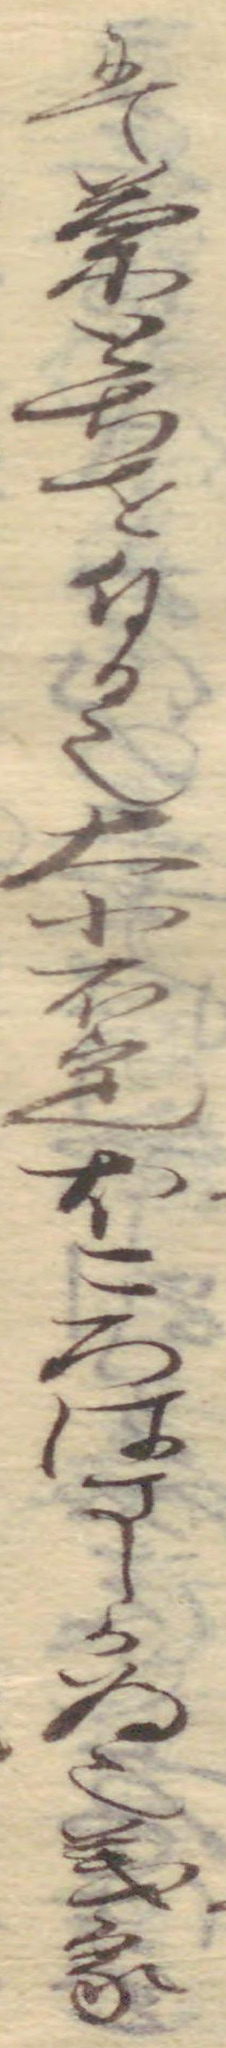にて菊とちを付る也大小不定ほころはさしか為也義家
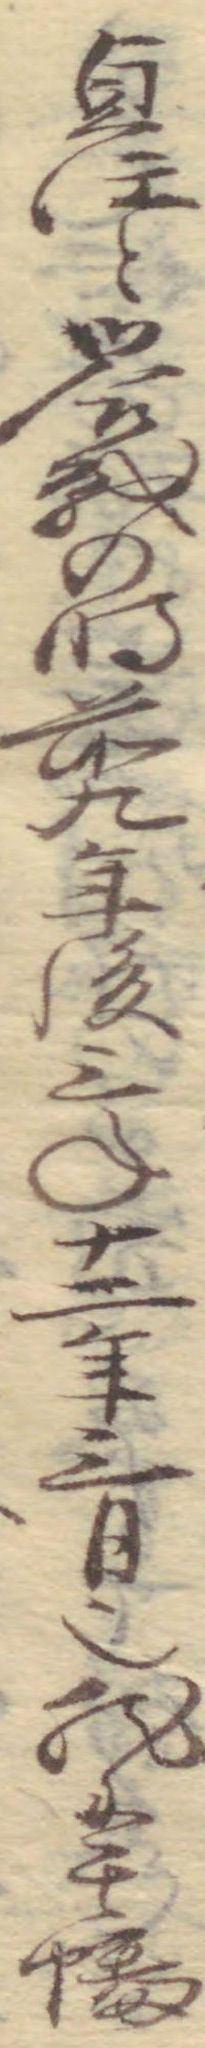貞任と御合戦の時前九年後三年十二月三日也然に其幡
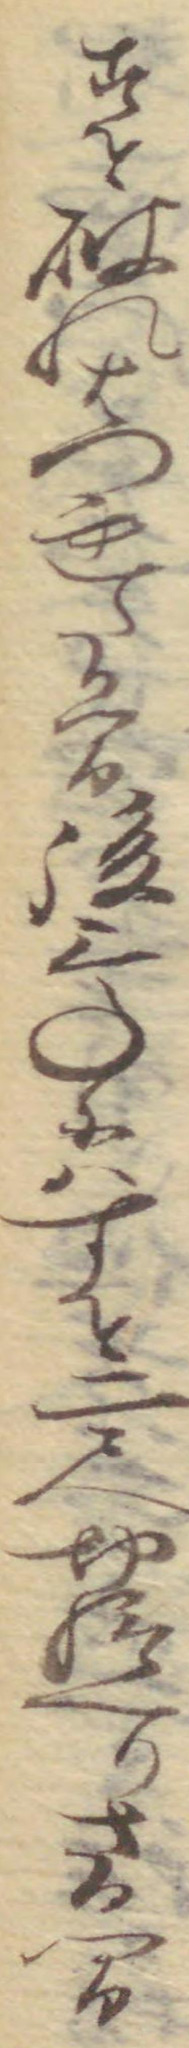すそ破れはつれたる間後三年にハすそ二尺切結へりさる間
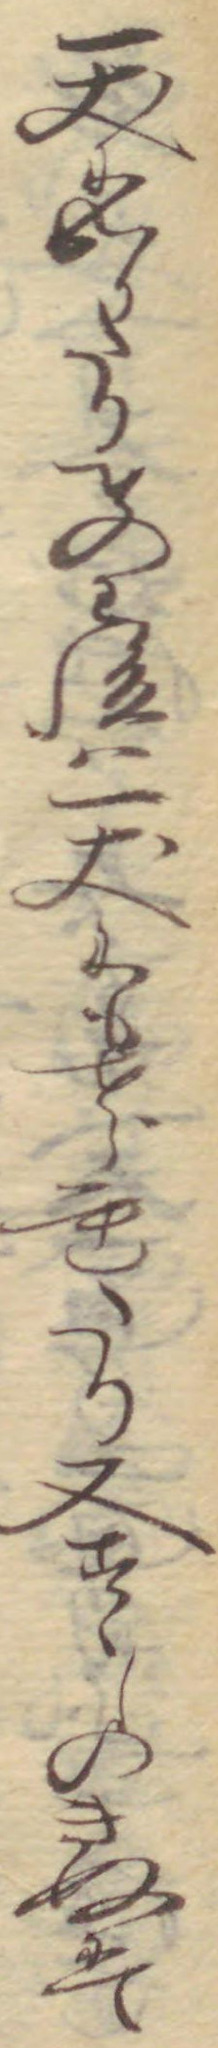一丈に成りたりその已後ハ一丈にもせられたり又すゝしのきぬにて
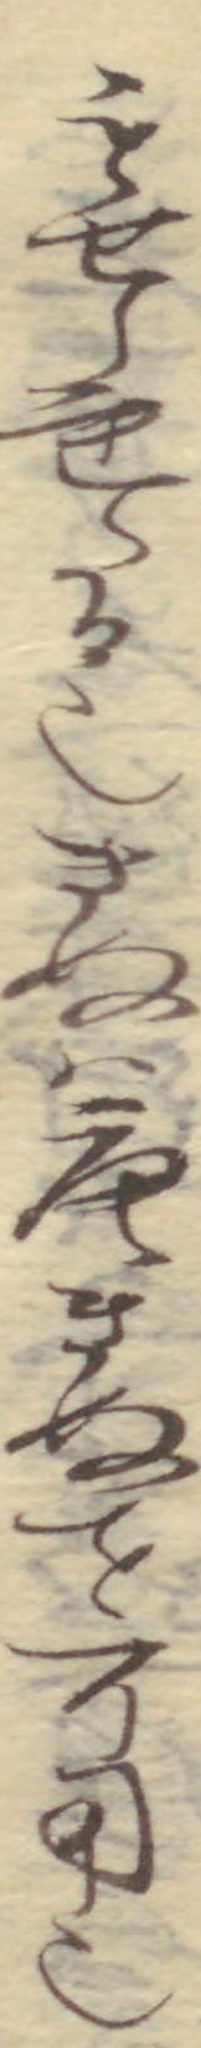もせられたる也きぬハ唐きぬを可用也
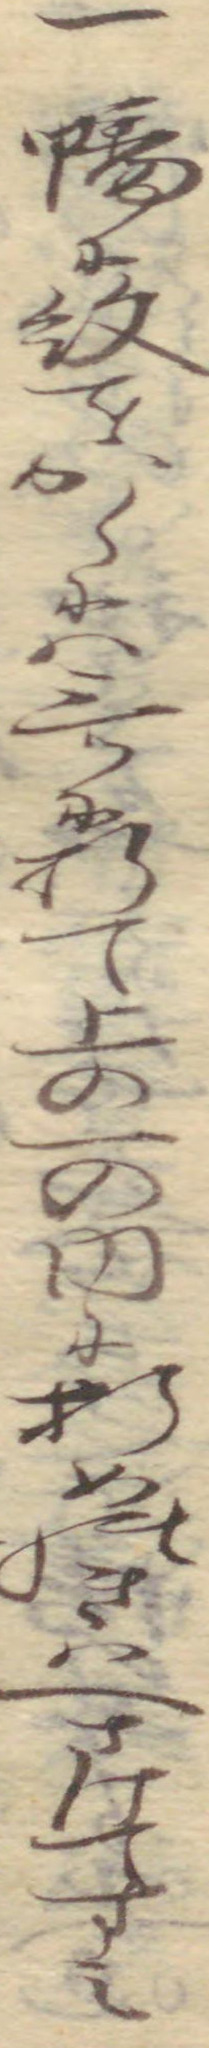一幡に紋をかくにハ三ツに折て上の一の内に折めのきハへさけてすミ
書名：鶯宿雑記. 巻199-200
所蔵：国立国会図書館 National Diet Library, JAPAN
